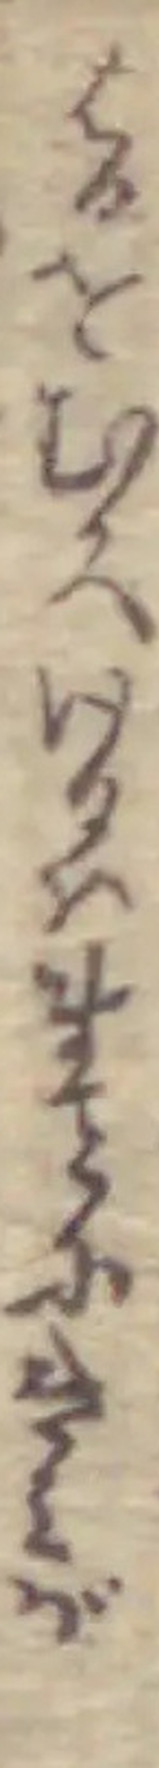はるをむかへけるはまことにきみが
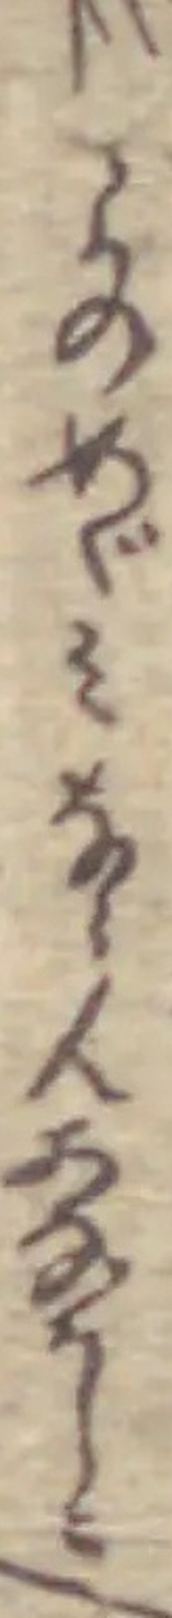よのめぐみならんあなかしこ
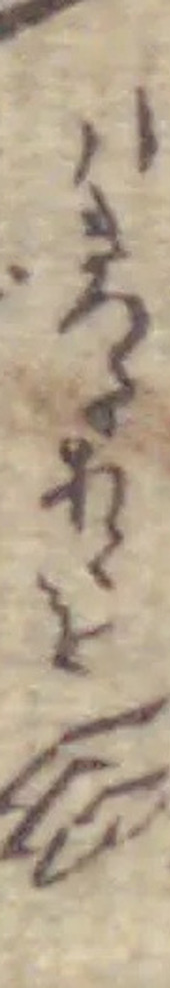はきつたあとを
